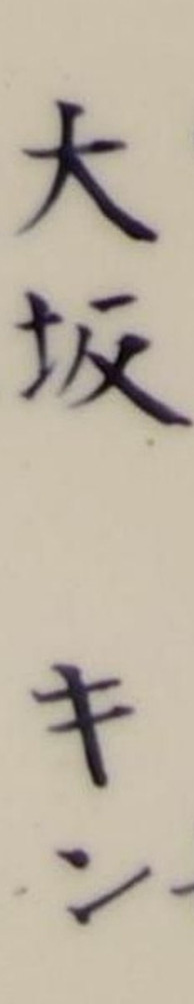大坂キン
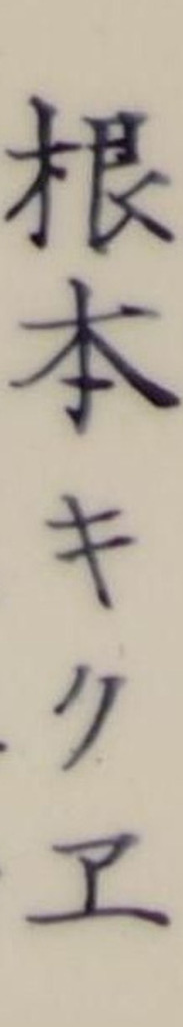根本キクヱ
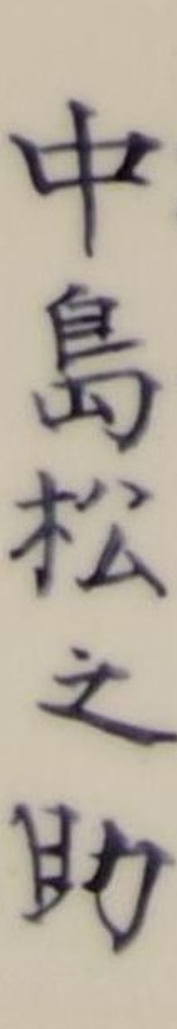中島松之助
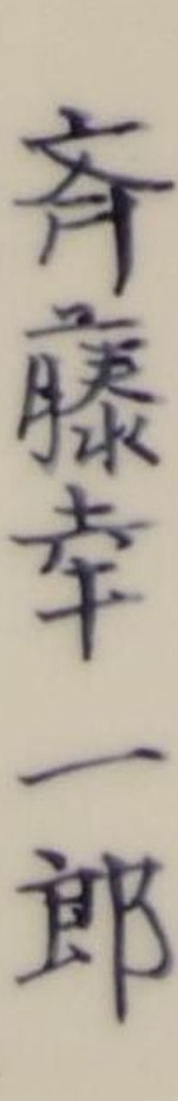斉藤幸一郎
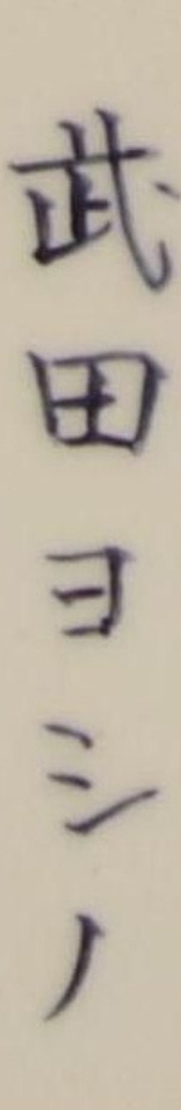武田ヨシノ
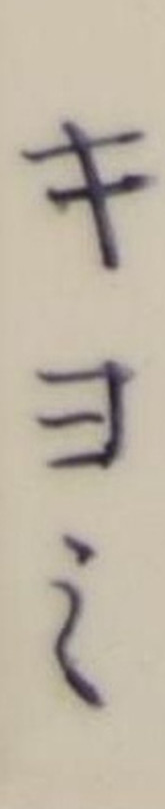キヨミ

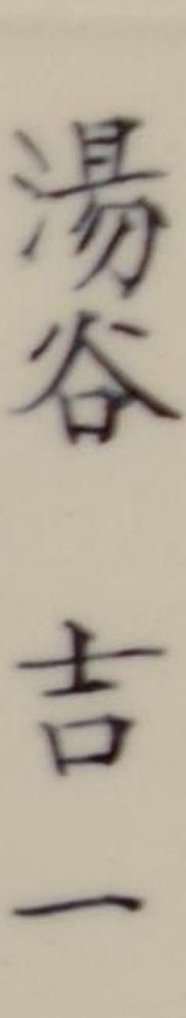湯谷吉一
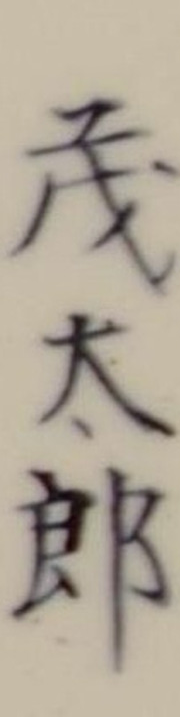茂太郎
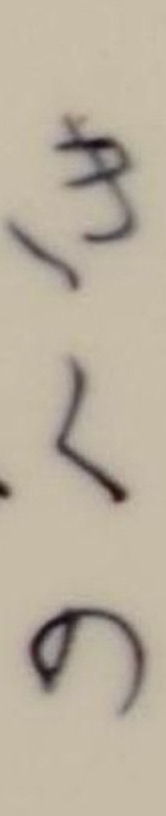きくの
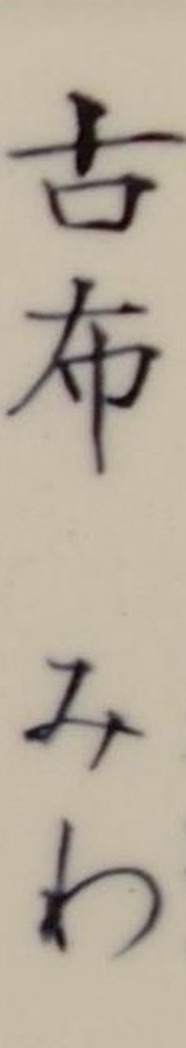古布みわ
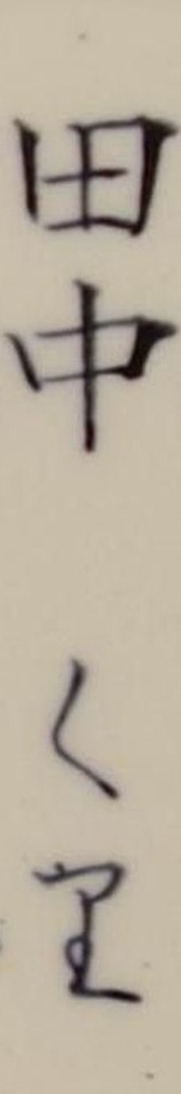田中くり
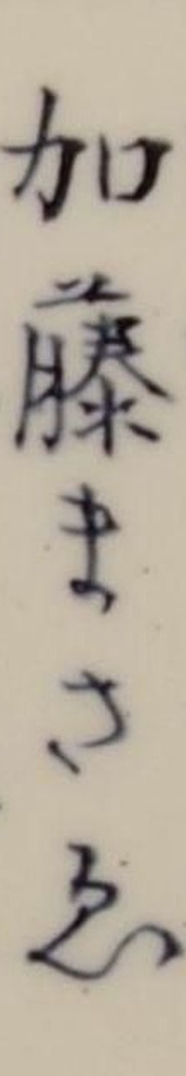加藤まさゑ
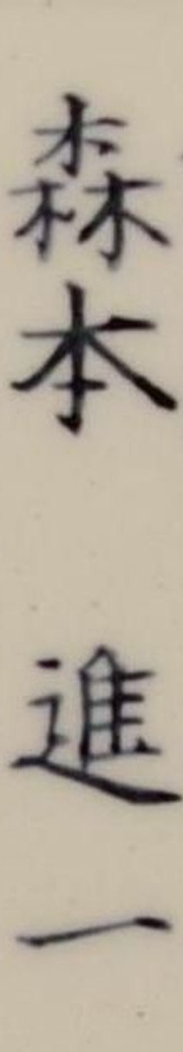森本進一
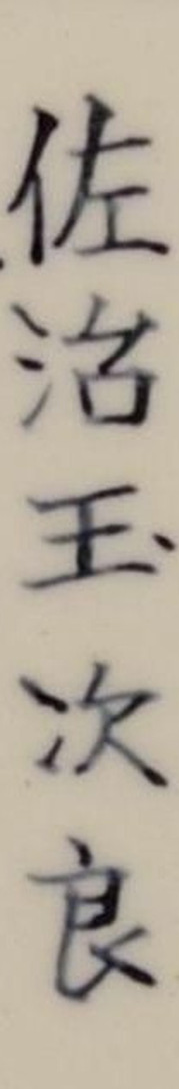佐治玉次良
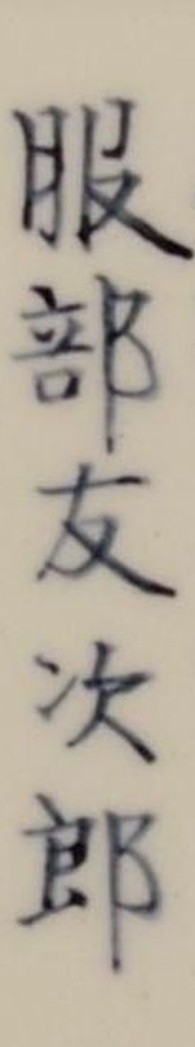服部友次郎
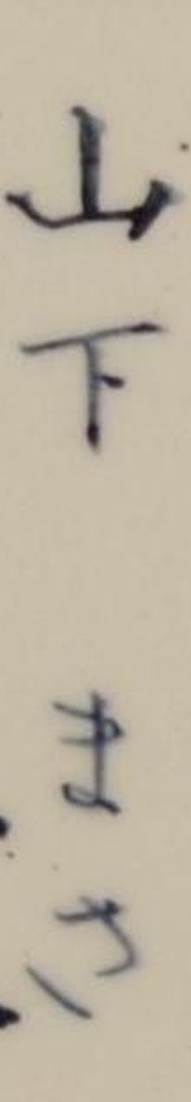山下まさ
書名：E~L
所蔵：高野山金剛峯寺
